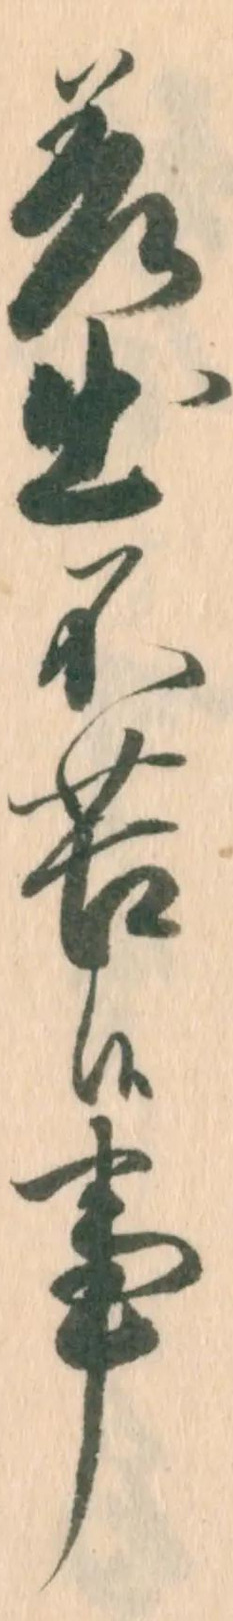差出不苦候事
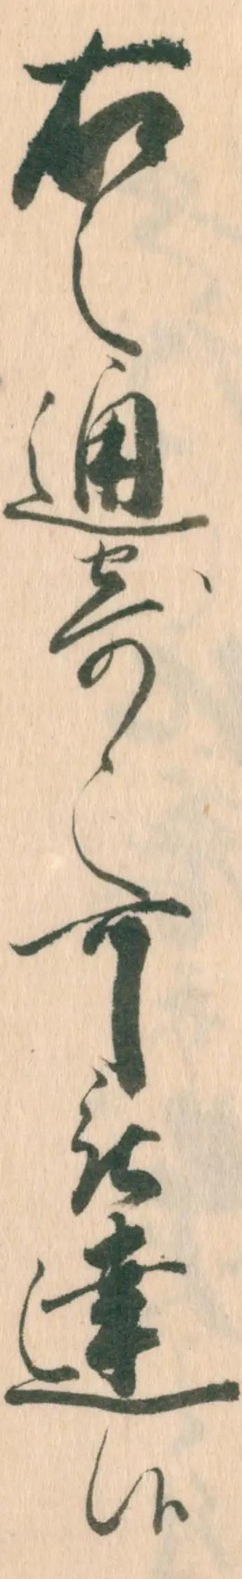右之通寄〻可被達候

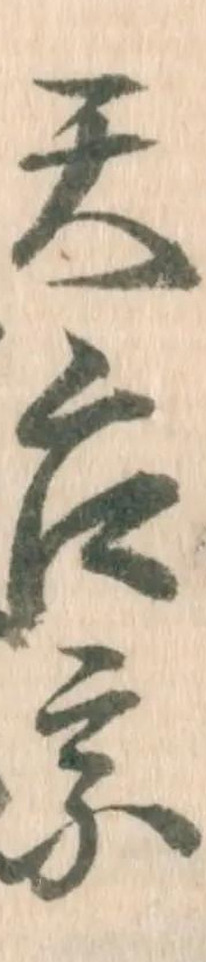天台宗
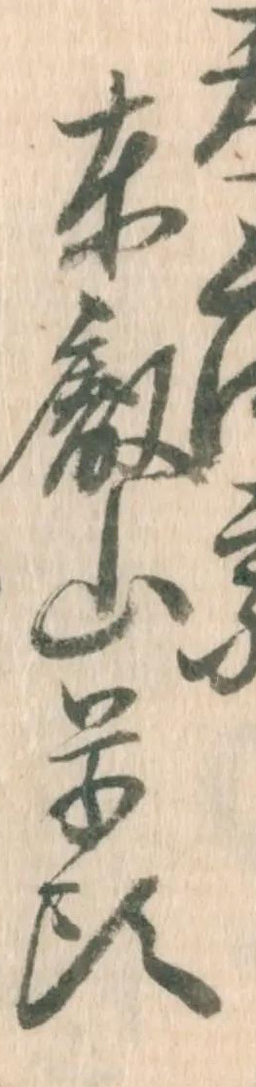東叡山学頭
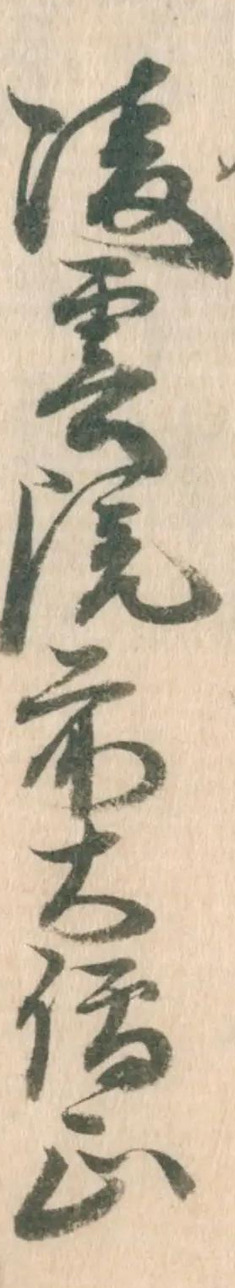凌雲院前大僧正
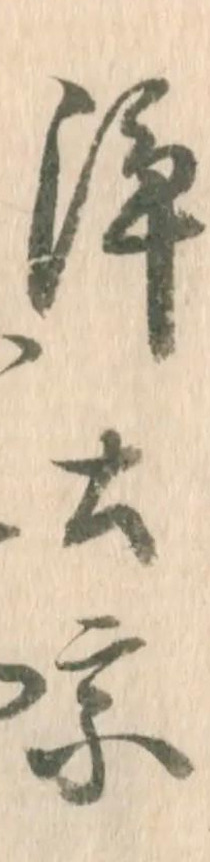浄土宗

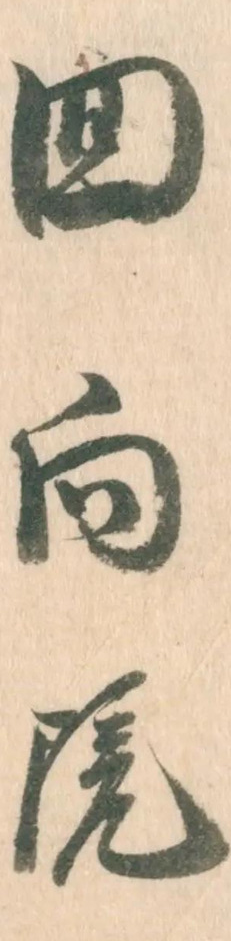回向院
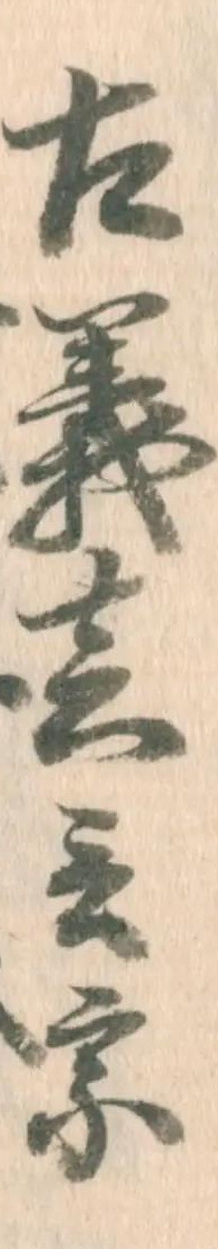古義真言宗
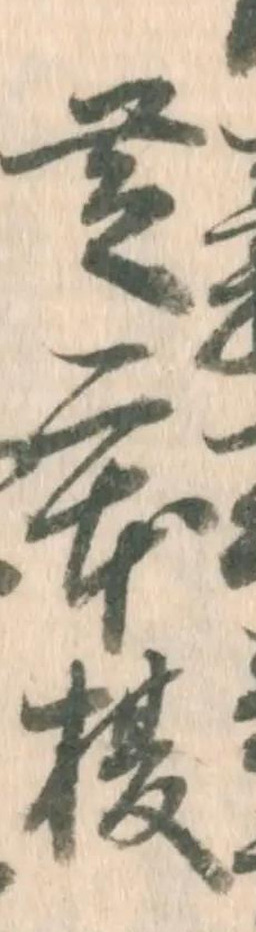芝二本榎
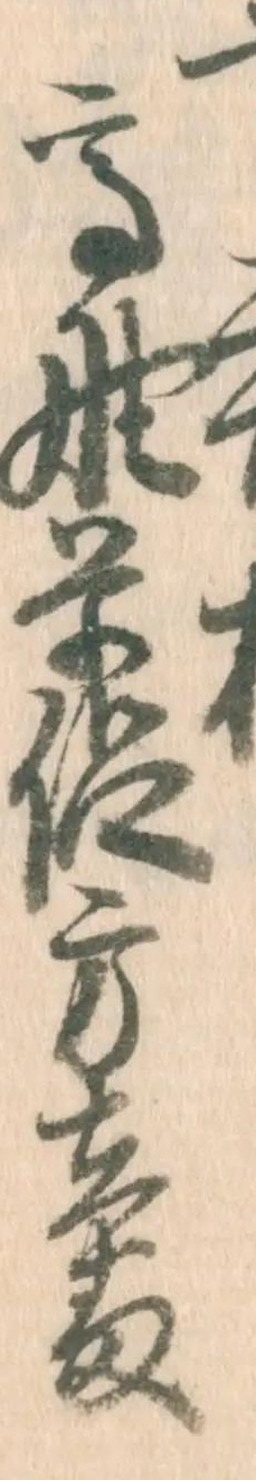高野学侶方在番
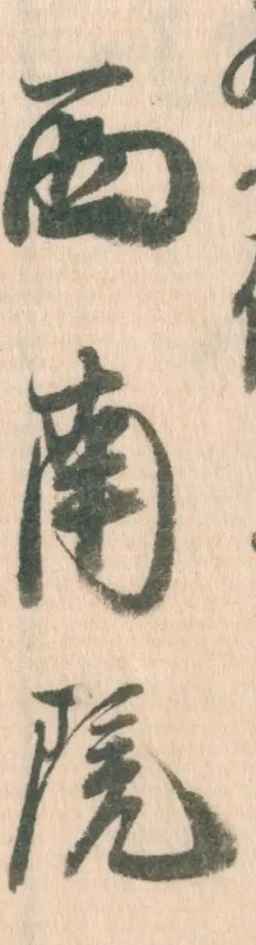西南院
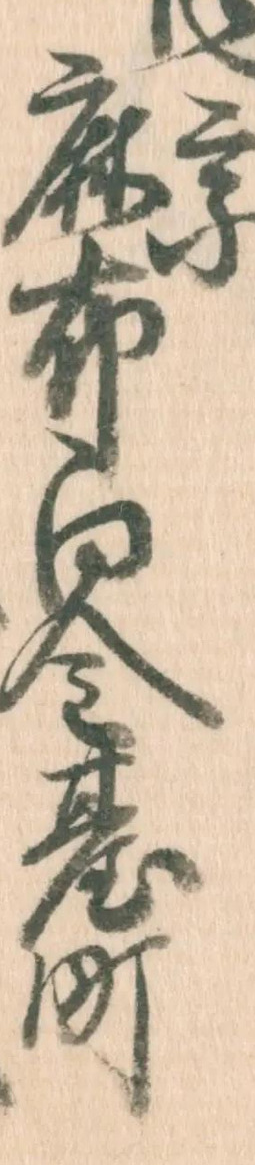麻布白金台町
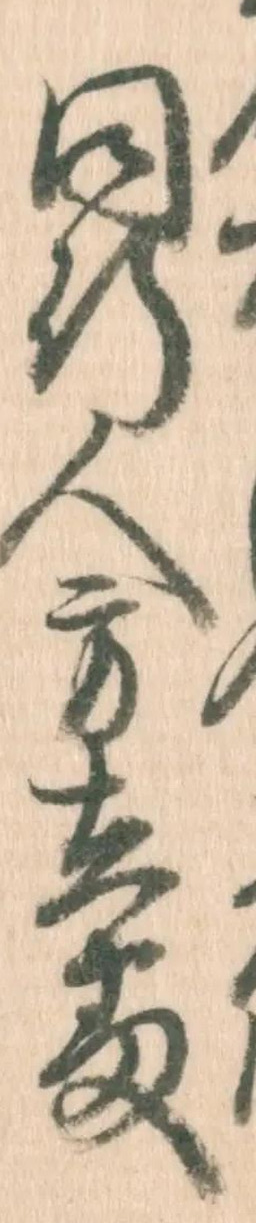同行人方在番
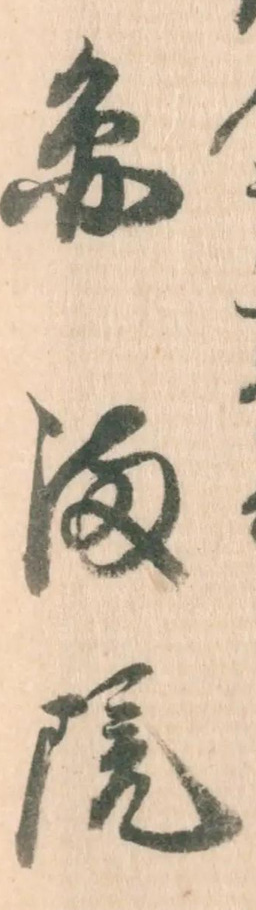円満院
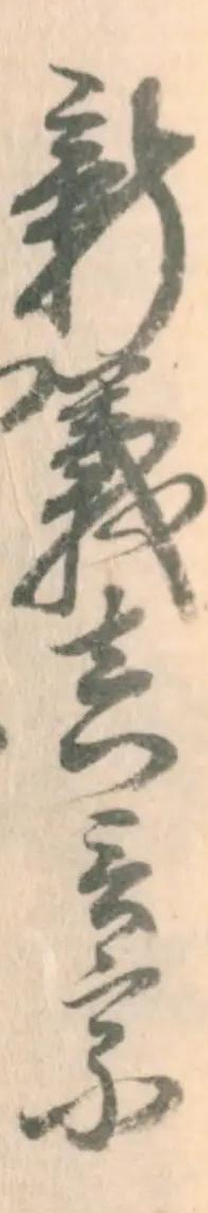新義真言宗
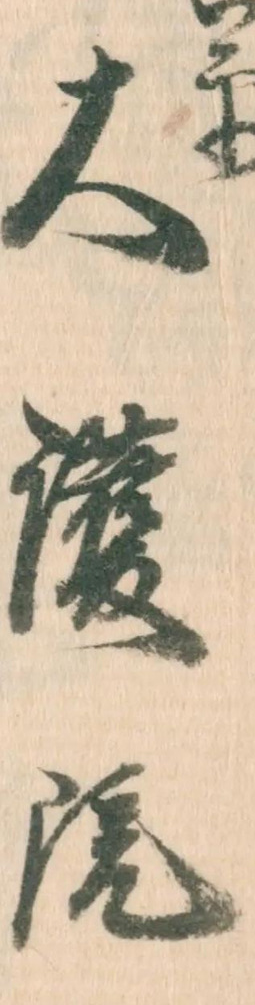大護院
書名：地震災書留 2巻. [2] 内表紙に「地震一件　安政二卯年十月」とあり
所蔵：国立国会図書館 National Diet Library, JAPAN
